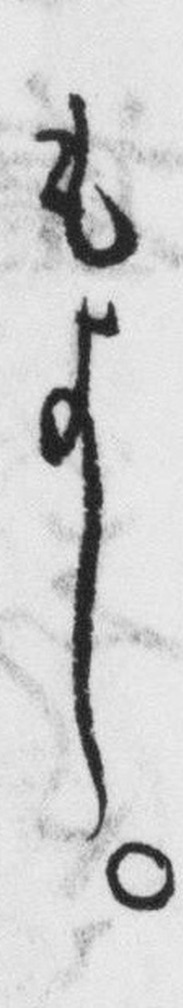もよし。
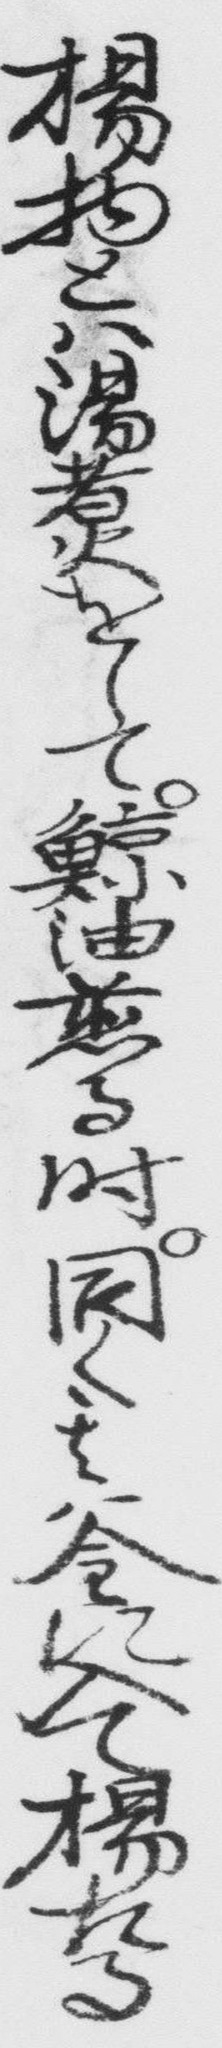揚物とは湯煮をして。鯨油煎る時。同く其釜に入て揚たる
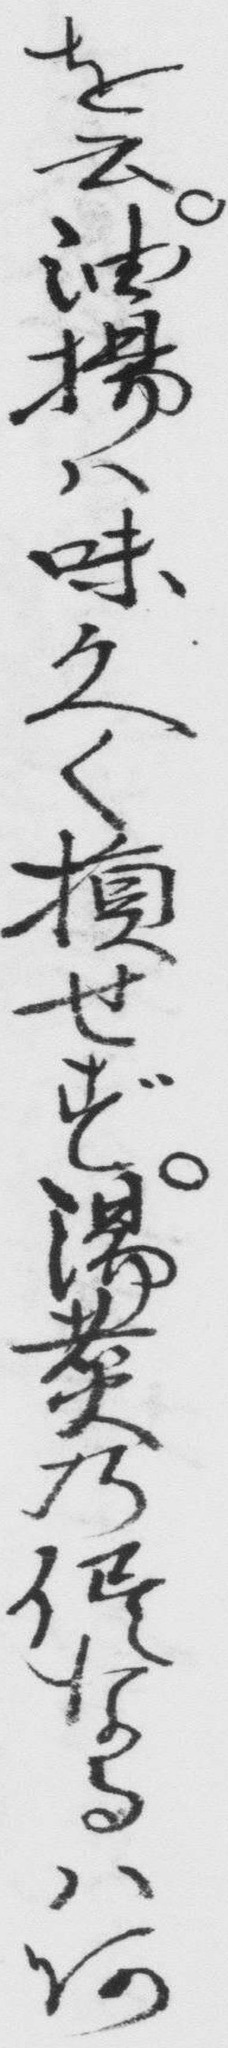を云。油揚は味久く損せず。湯煮の儘なるはあ
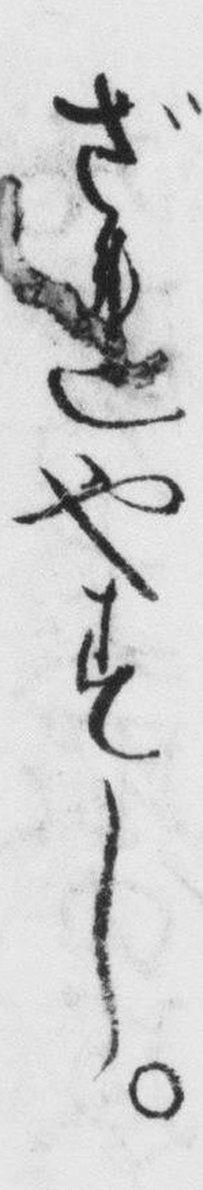ざれやすし。
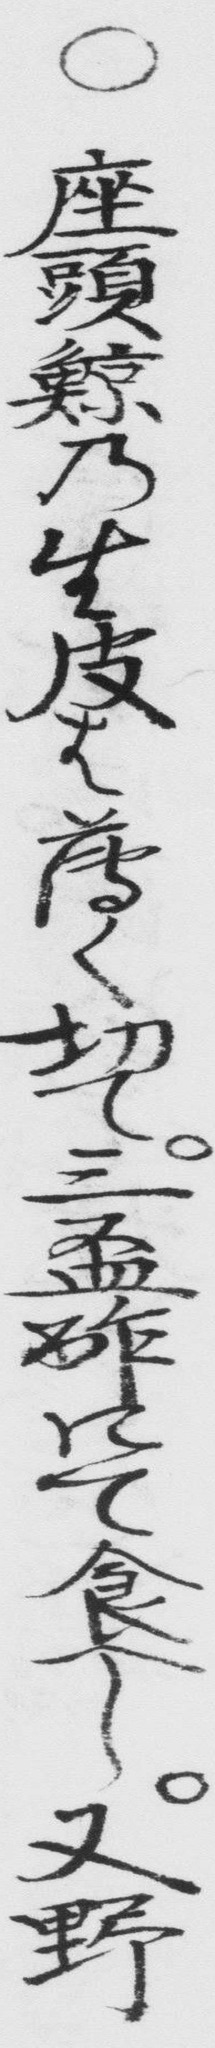○座頭鯨の生皮は薄く切て。三盃酢にて食へし。又野
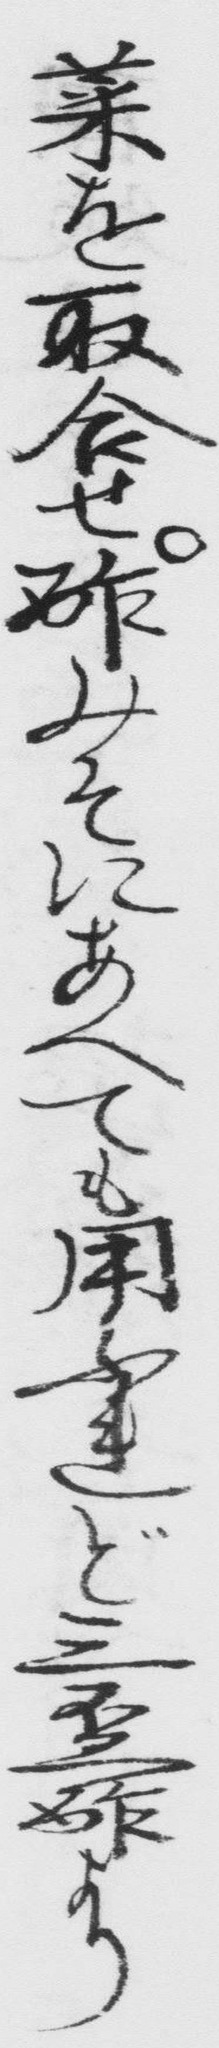菜を取合せ。酢みそにあへても用ふれど三盃酢より
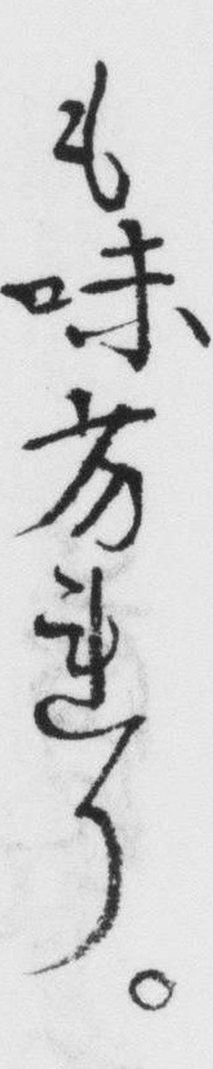も味劣れり。
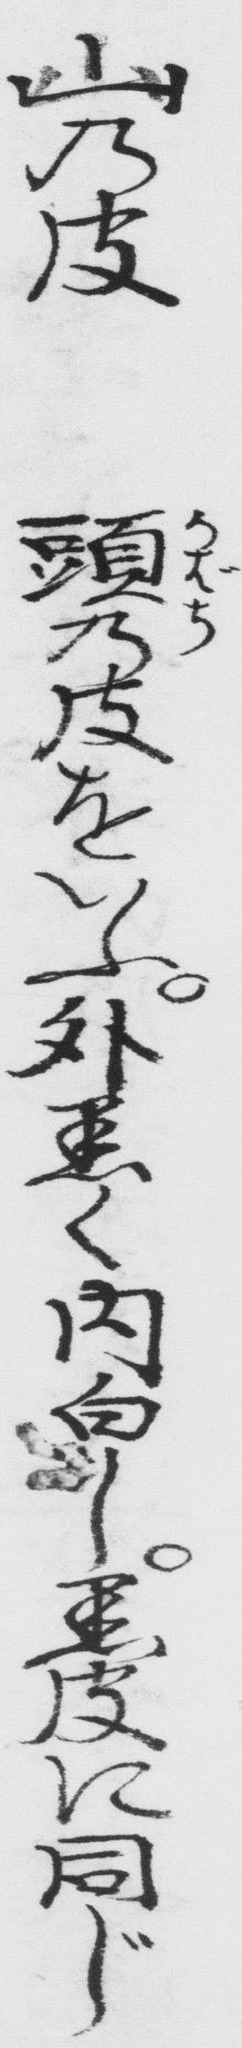山の皮頭の皮をいふ。外黒く内白し。黒皮に同じ

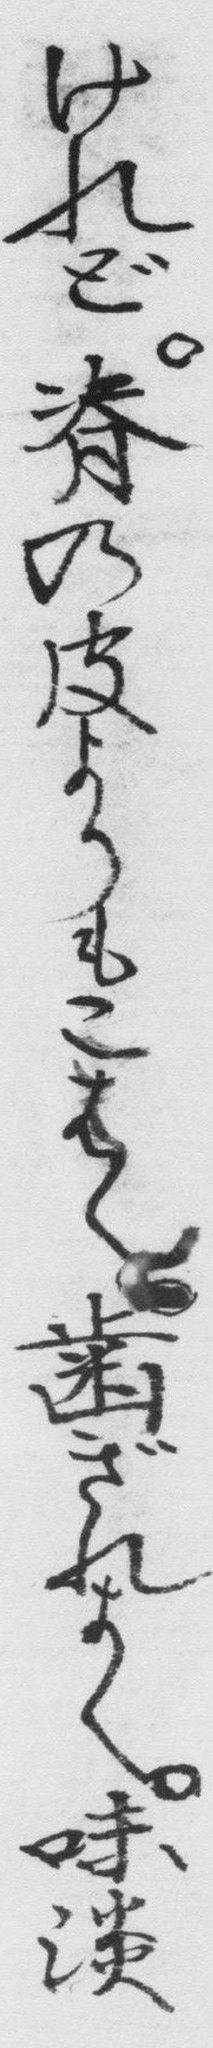けれど。背の皮よりもこはく歯ぎれよく。味淡
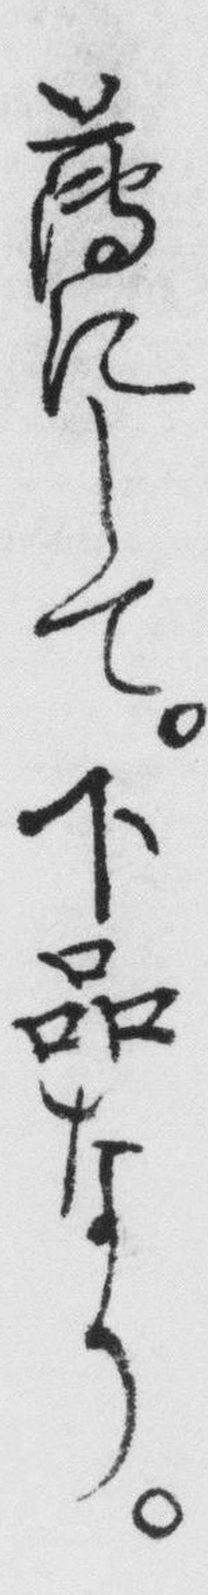薄にして。下品なり。
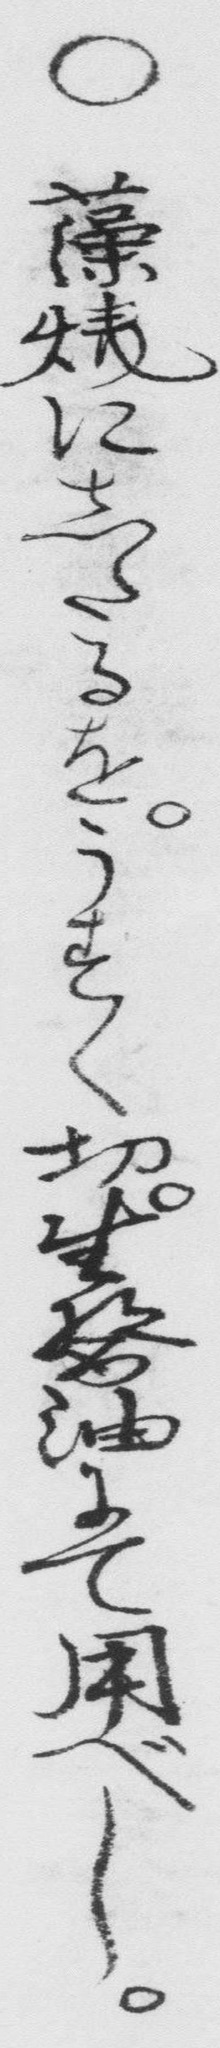○藻焼にしたるを。うすく切。生醤油にて用べし。
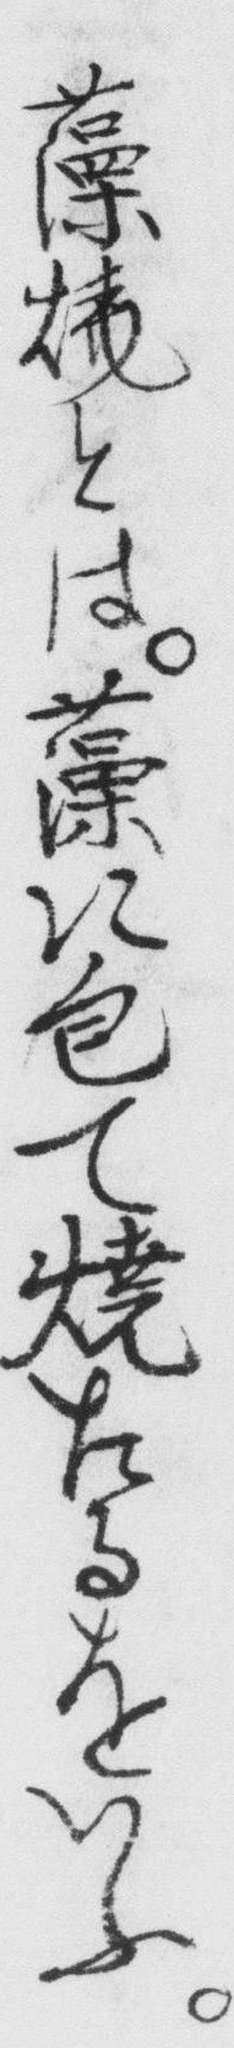藻焼とは。藻に包て焼きたるをいふ。
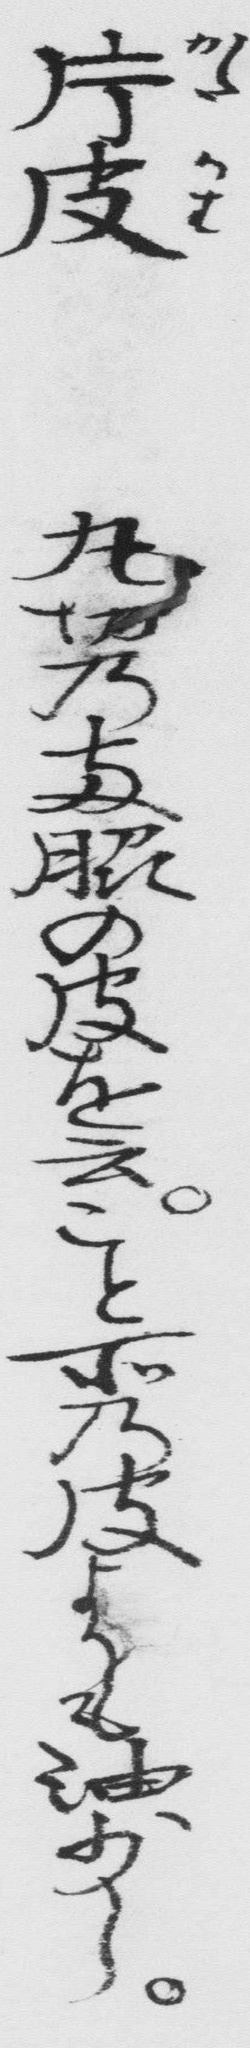片皮丸切の両脇の皮を云。こと所の皮よりも油少し。
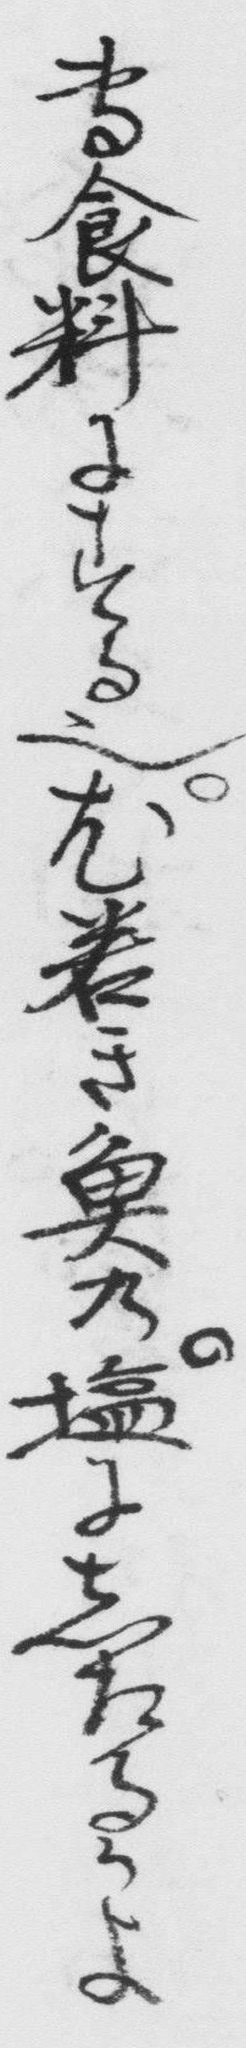専食料にする也。尤若き魚の。塩にしたるかよ
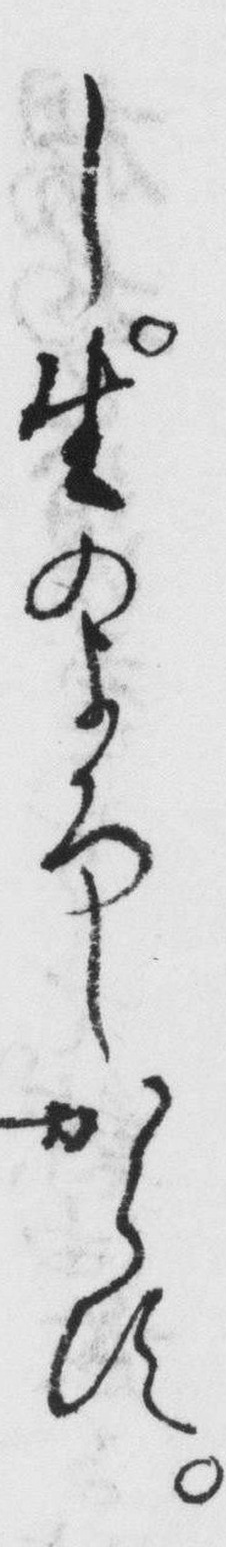し。生のよろしからす。
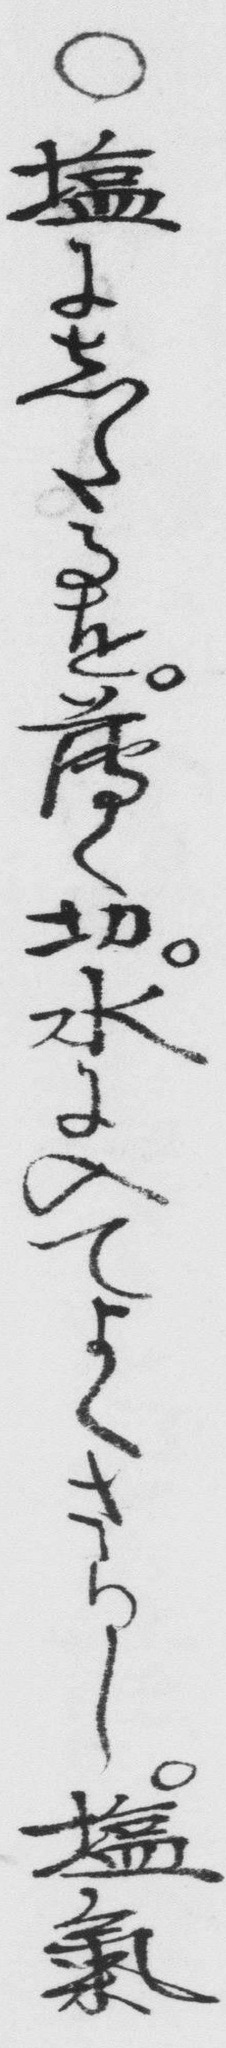○塩にしたるを。薄く切。水に入てよくさらし。塩気
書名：鯨肉調味方
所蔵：大阪府立大学学術情報センター 国文学研究資料館
